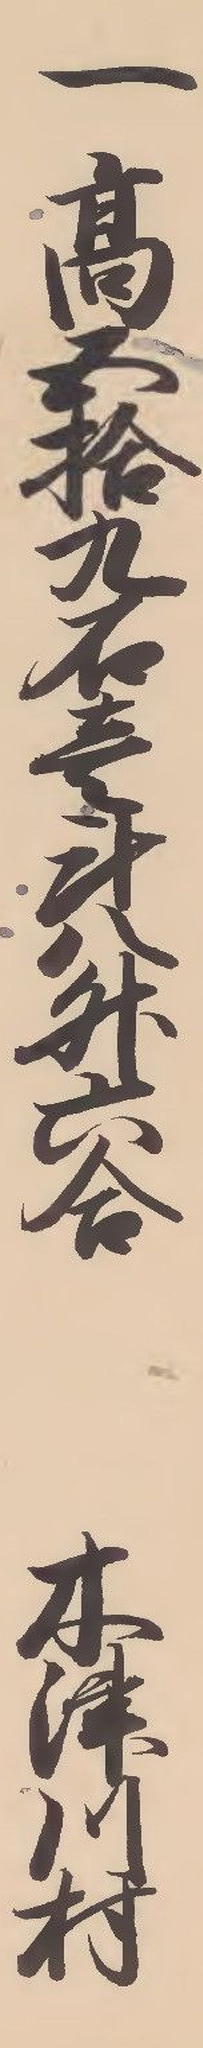一高五拾九石壱斗八升六合木津川村
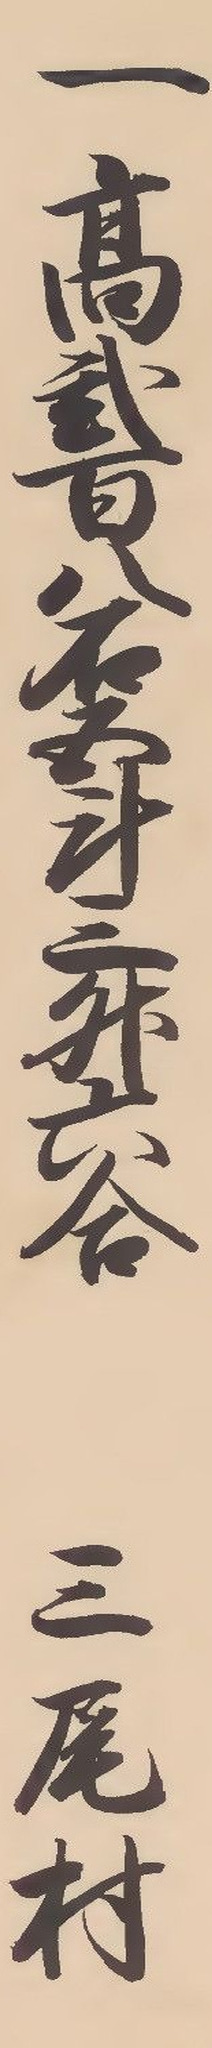一高弐百八石五斗三升六合三尾村
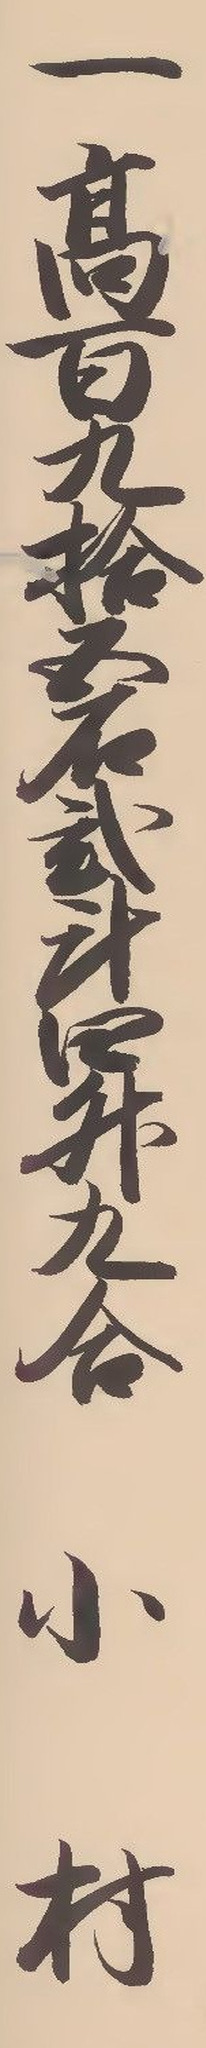一高百九拾五石弐斗四升九合小村
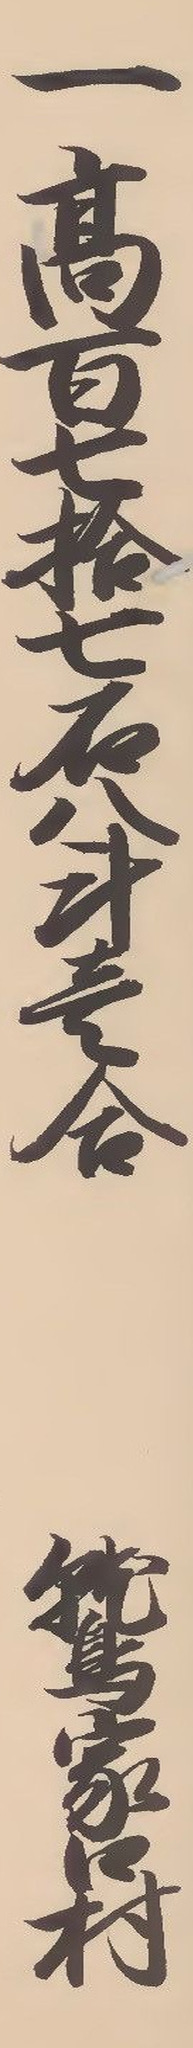一高百七拾七石八斗壱合鷲家口村
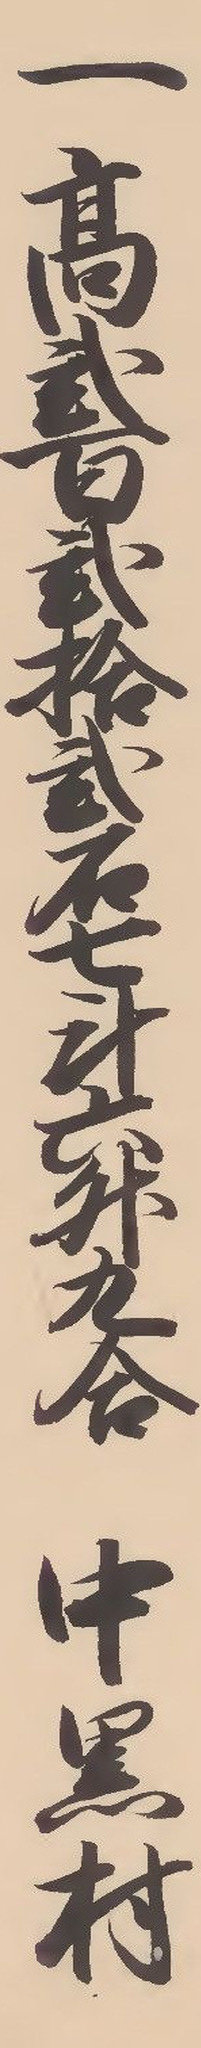一高弐百弐拾弐石七斗六升九合中黒村
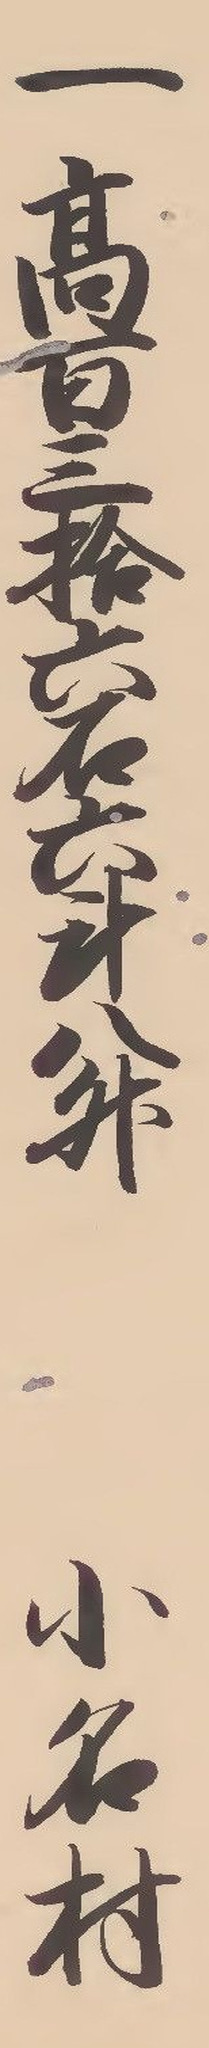一高百三拾六石六斗八升小名村

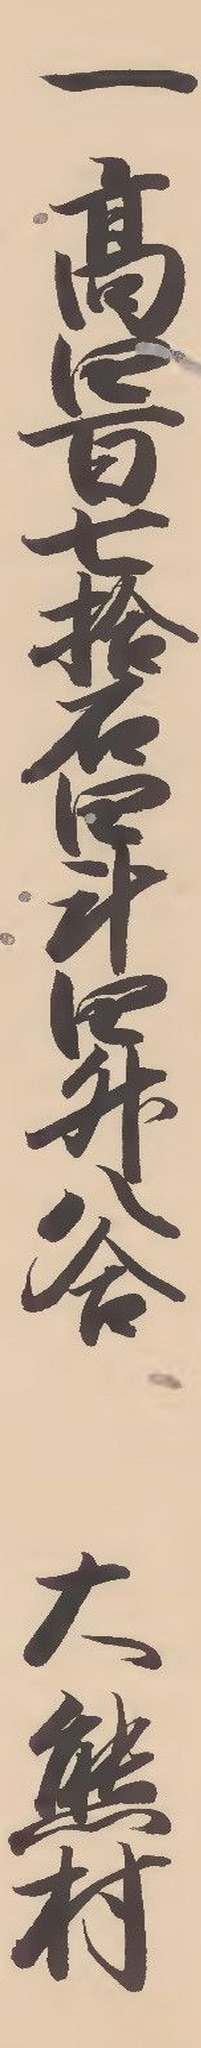一高四百七拾石四斗四升八合大熊村
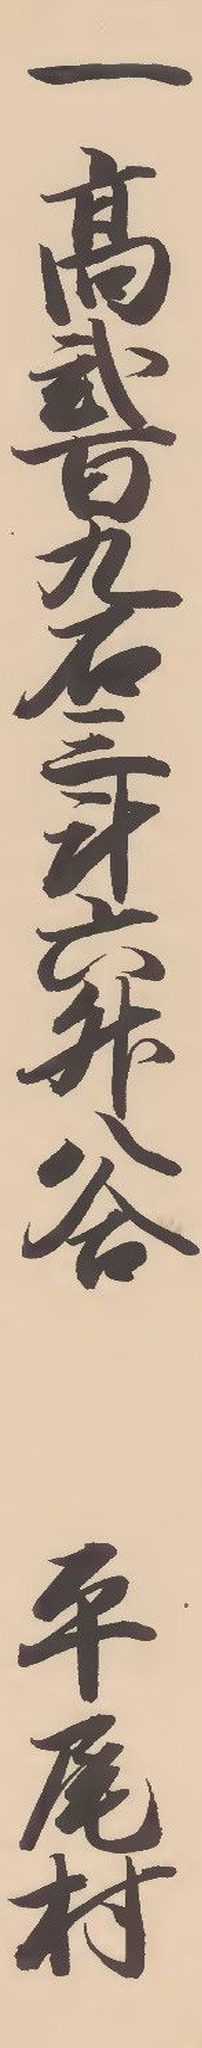一高弐百九石三斗六升八合平尾村
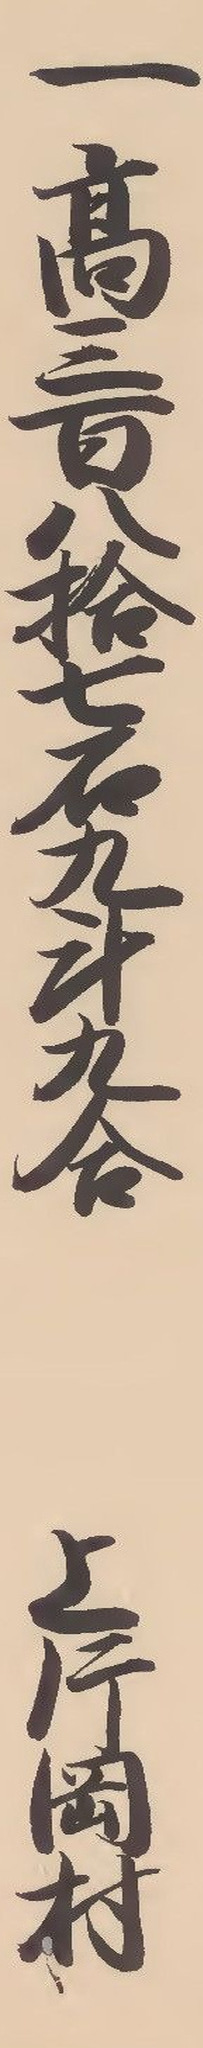一高三百八拾七石九斗九合上片岡村
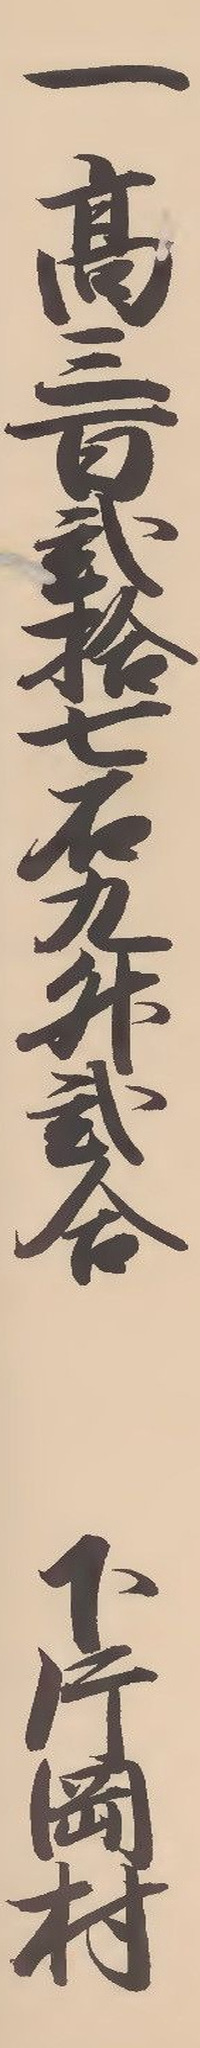一高三百弐拾七石九升弐合下片岡村
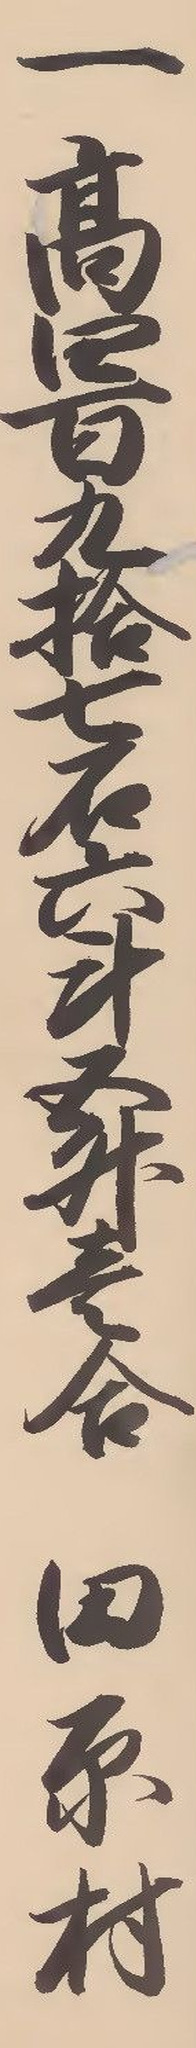一高四百九拾七石六斗五升壱合田原村
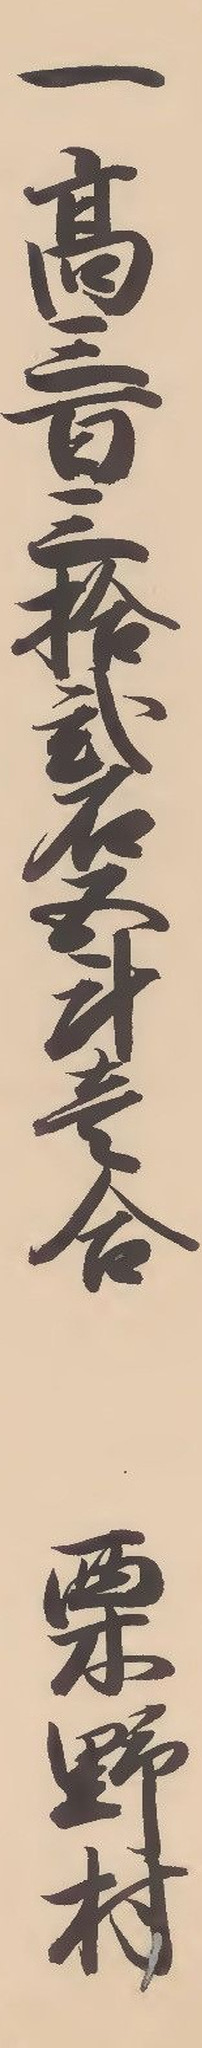一高三百三拾弐石五斗壱合栗野村
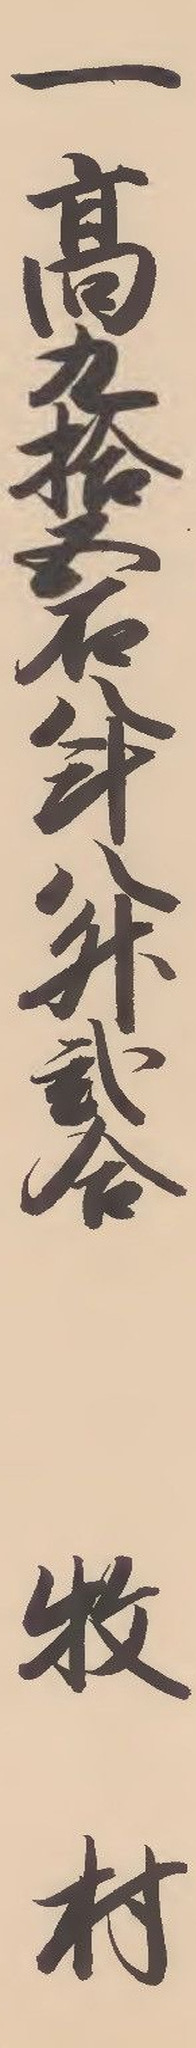一高九拾五石八斗八升弐合牧村
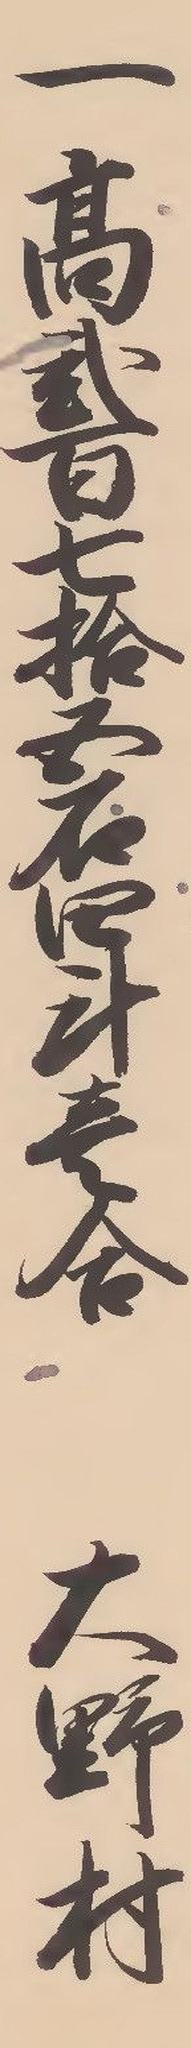一高弐百七拾五石四斗壱合大野村

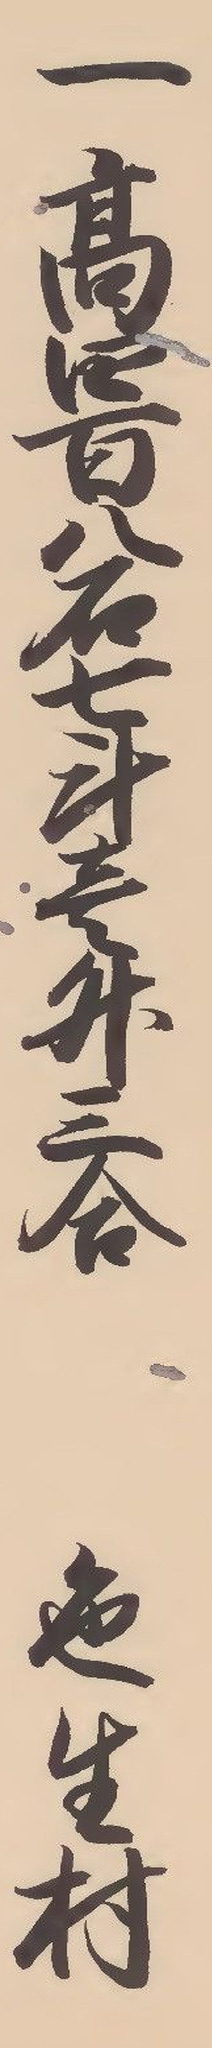一高四百八石七斗壱升三合色生村
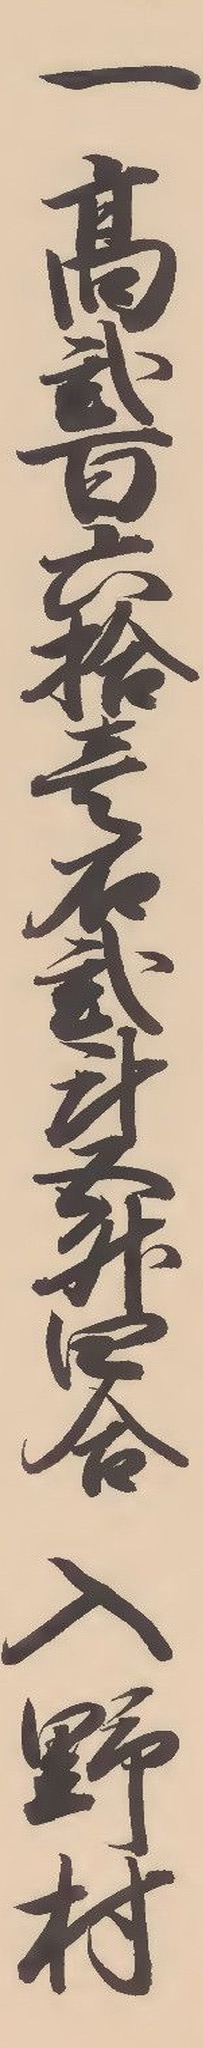一高弐百六拾壱石弐斗五升四合入野村
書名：大和国郷帳
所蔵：国立公文書館 National Archives of Japan
